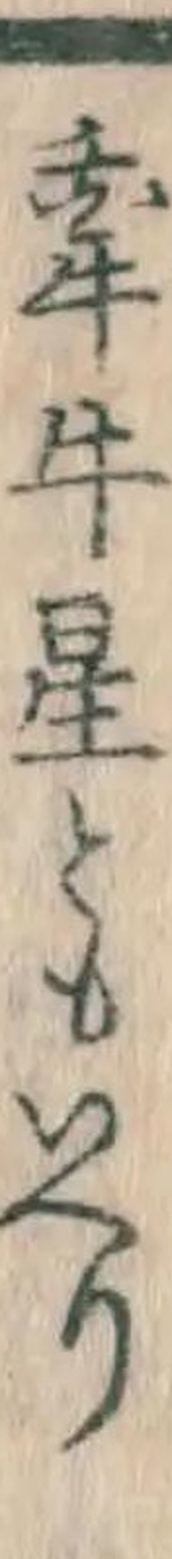牽牛星ともいへり
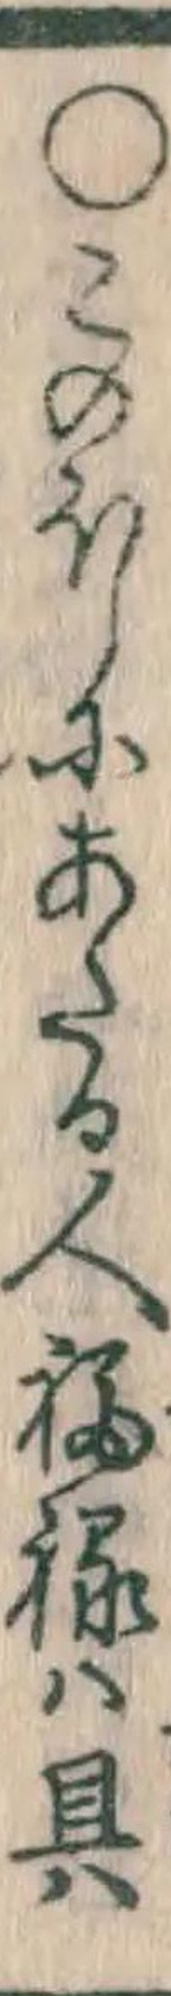○このほしにあたる人福禄は具
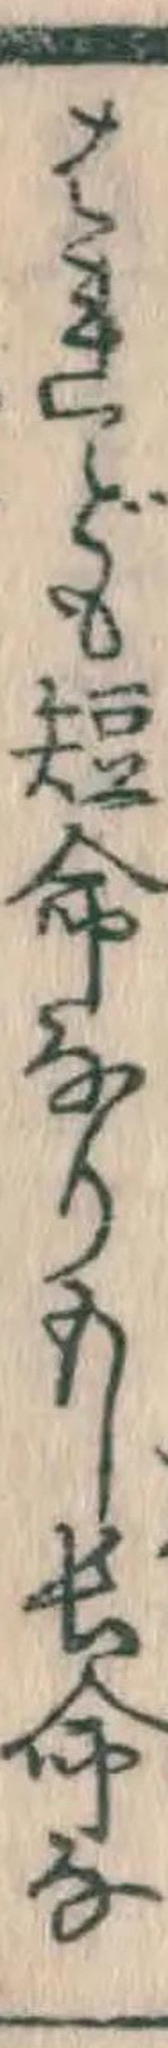はれども短命なりもし長命な
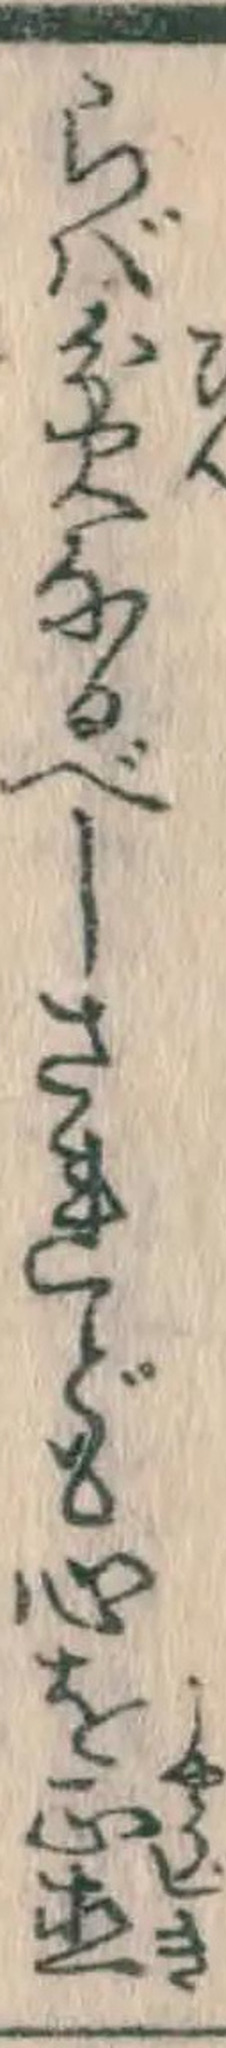らば貧なるべしされども心を正直
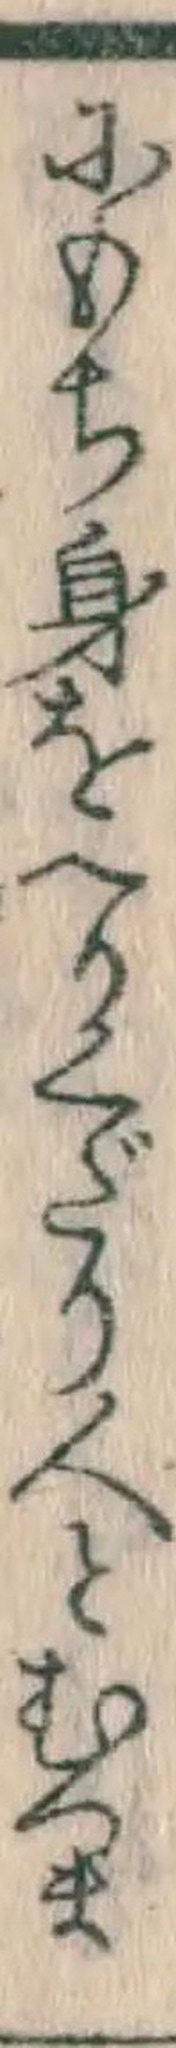にもち身をへりくだり人とむつま
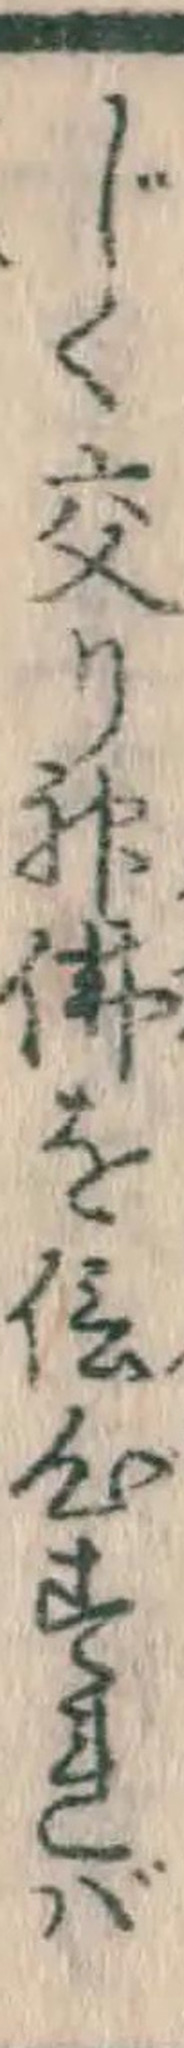じく交り神仏を信心すれば
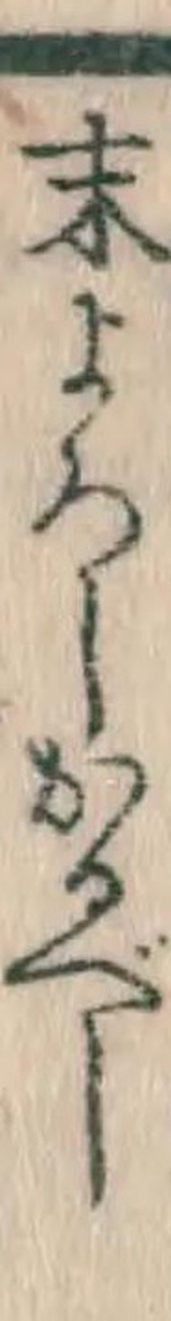末よろしかるべし
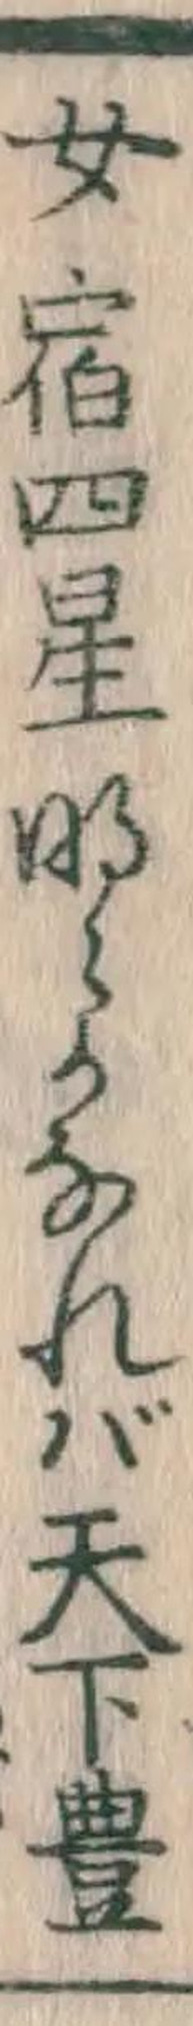女宿四星明らかなれば天下豊
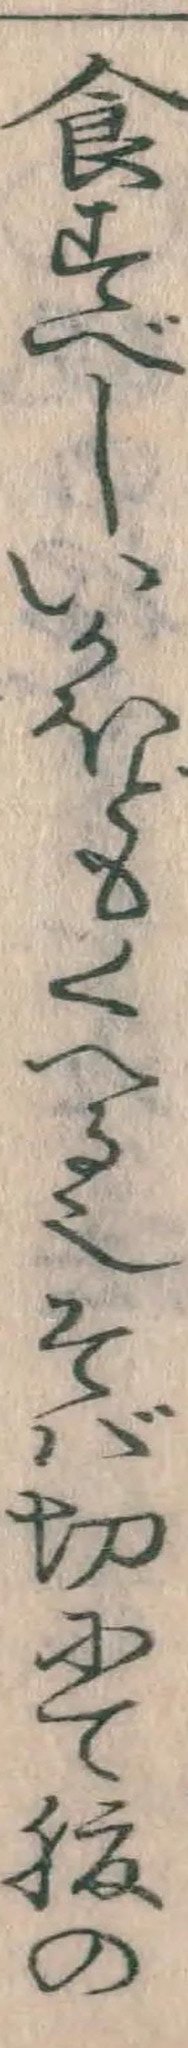食すべしいかほどもくへる也そば切にて腹の
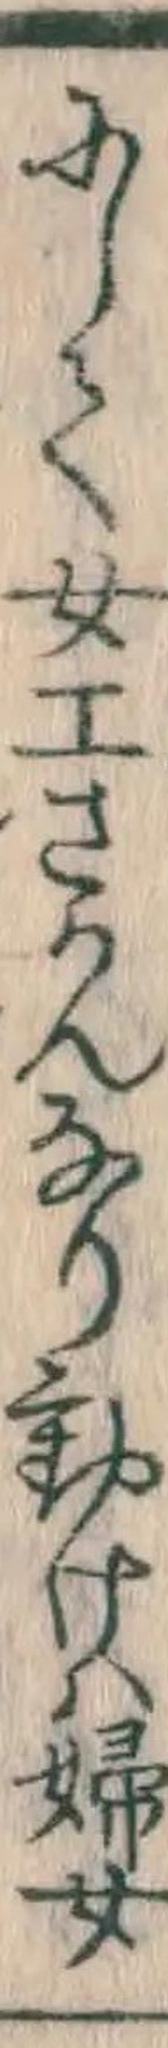にして女工さかんなり動けは婦女
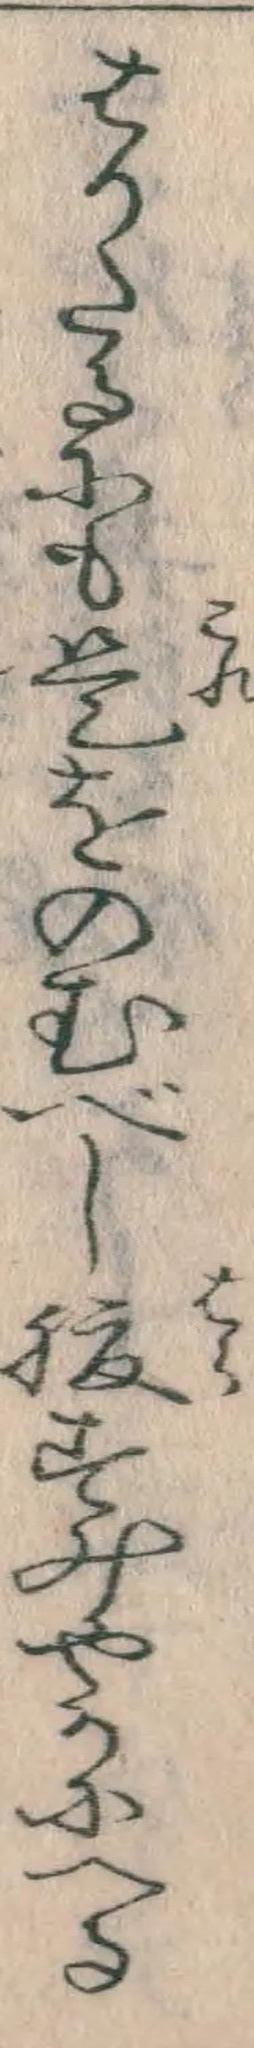はりたるにも是をのむべし腹すみやかにへる
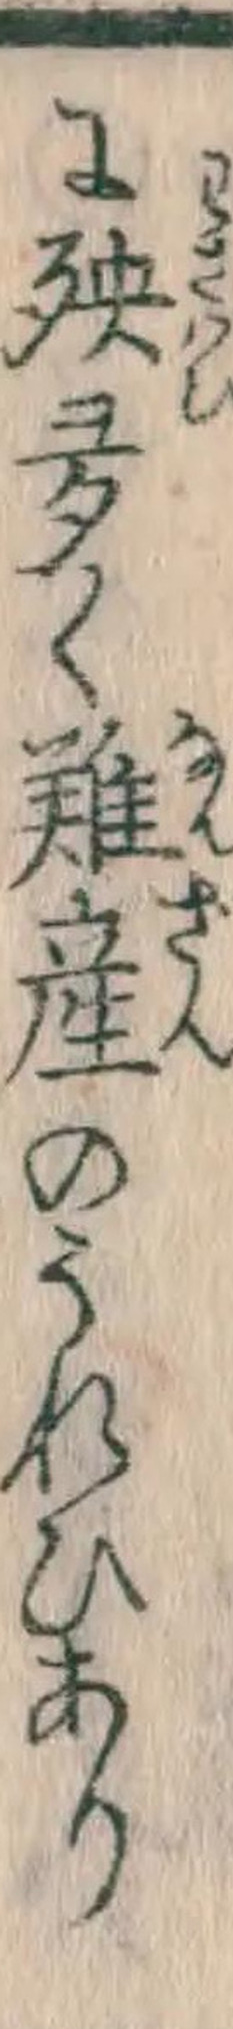に殃多く難産のうれひあり
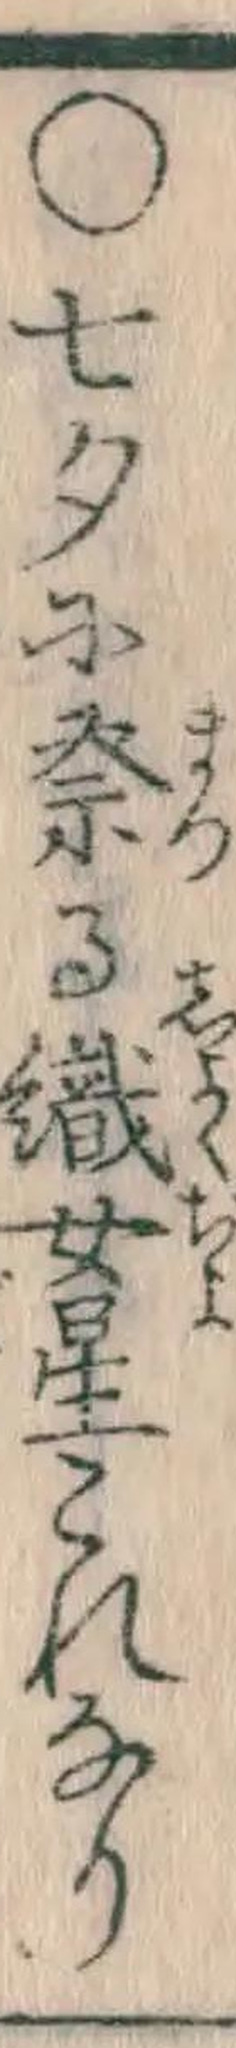○七夕に祭る織女星これなり
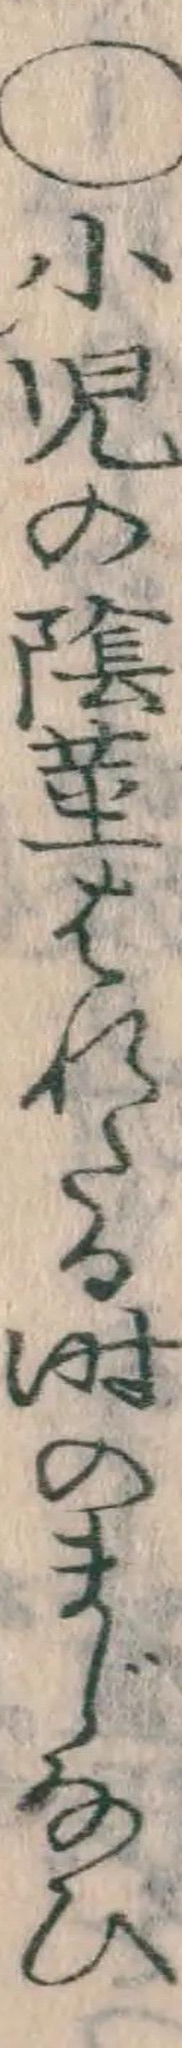○小児の陰茎はれたる時のまじなひ
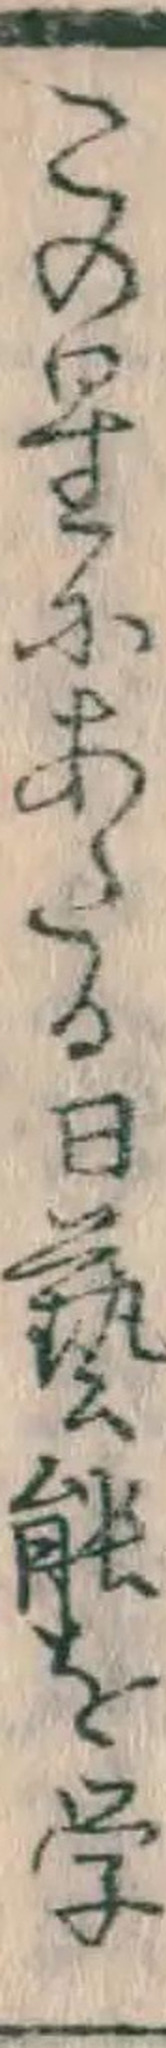この星にあたる日芸能を学
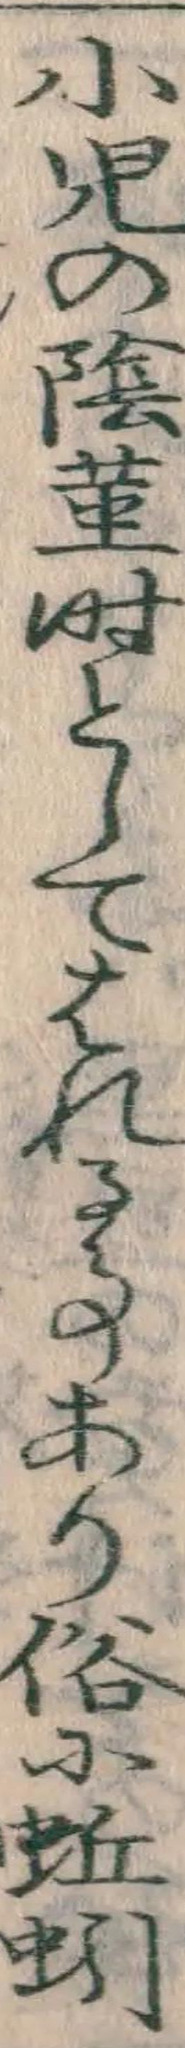小児の陰茎時としてはれる事あり俗に蚯蚓
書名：広益秘事大全 3巻. [2]
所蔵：国立国会図書館 National Diet Library, JAPAN
